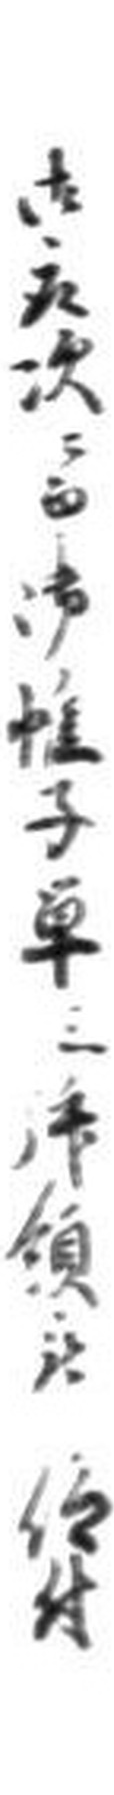御取次ニ而御帷子単三拝領被仰付
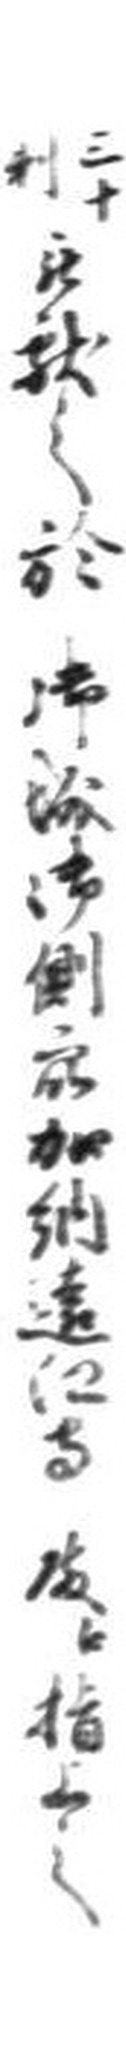刺被献之於御城御側衆加納遠江守殿江指上之

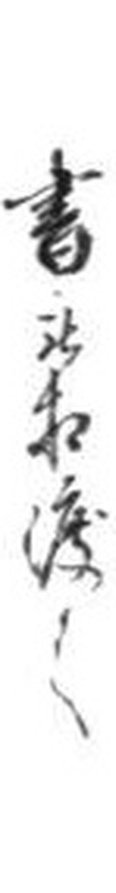書被相渡之
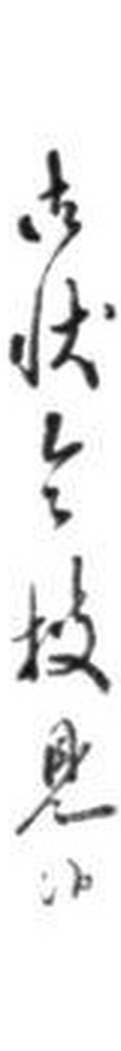御状令披見候
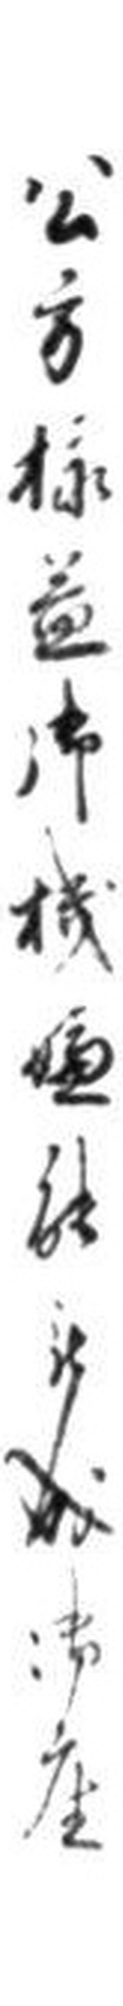公方様益御機嫌能被成御座
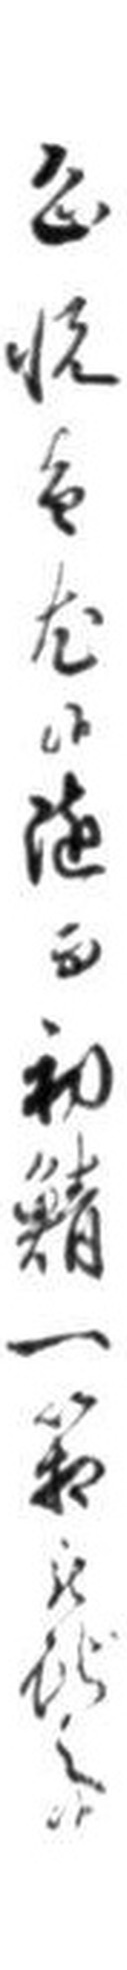恐悦旨尤候随而初鯖一箱被献之候
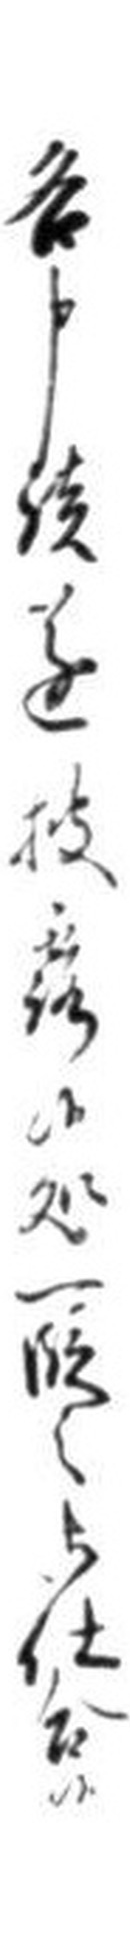各申談遂披露候処一段之御仕合候
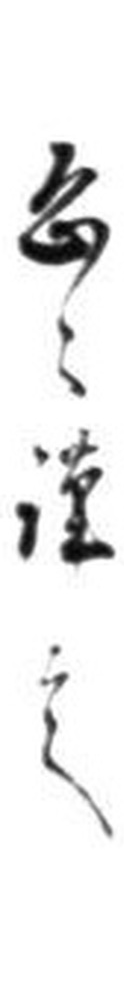恐々謹言
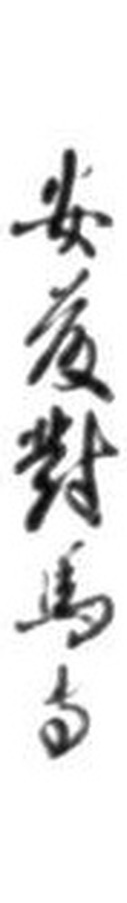安藤対馬守
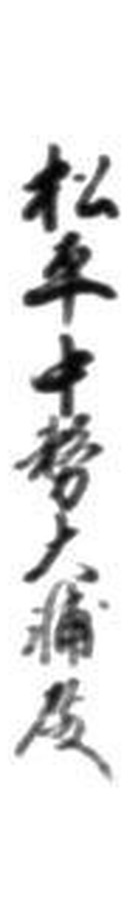松平中務大輔殿
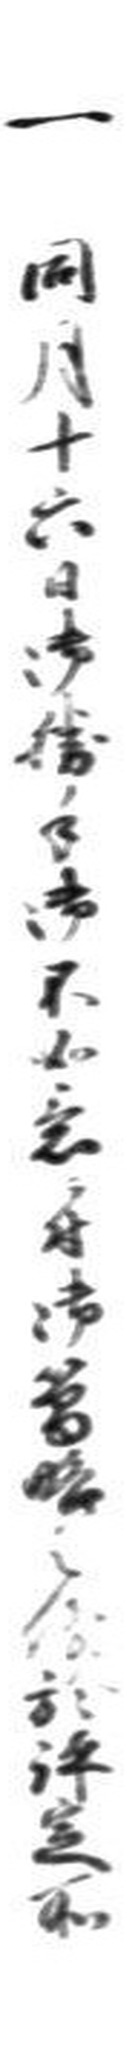一同月十六日御勝手御不如意ニ付御簡略之儀於評定所
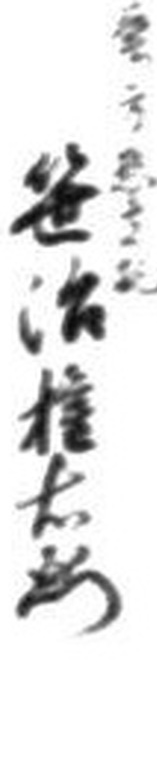笹治権右衛門
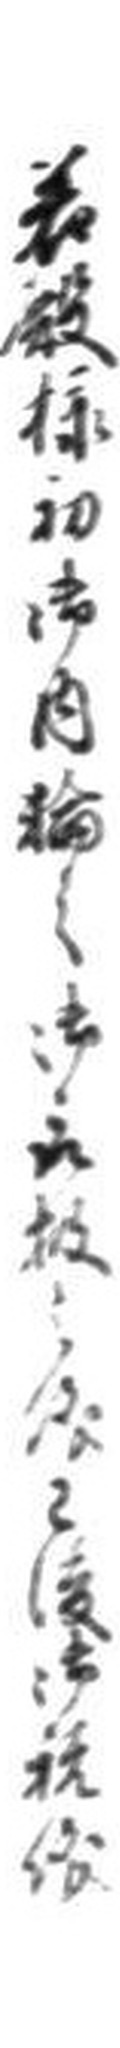若殿様初御内輪之御取扱之儀已後御祝儀

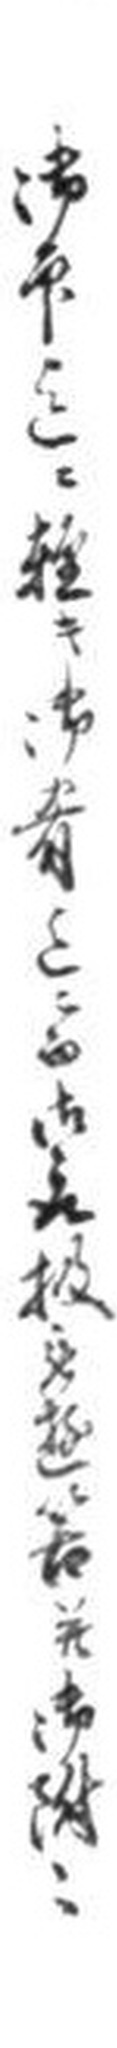御印迄ニ軽キ御肴迄ニ而御取扱被遊筈并御付々
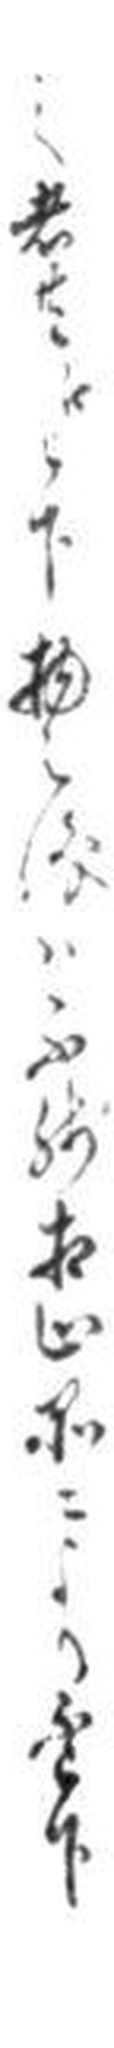之者共江被下物之儀ハ不残相止品ニより不被下
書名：家譜 三十六 宗昌公 従享保八年到同九年
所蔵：福井県文書館 Fukui Prefectural Archives
